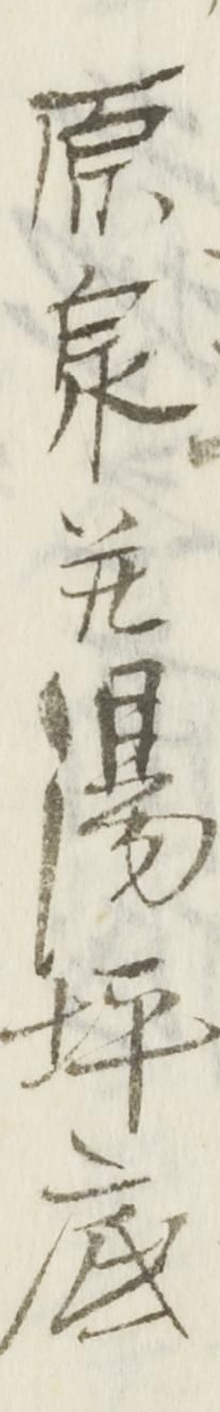原泉並湯坪底
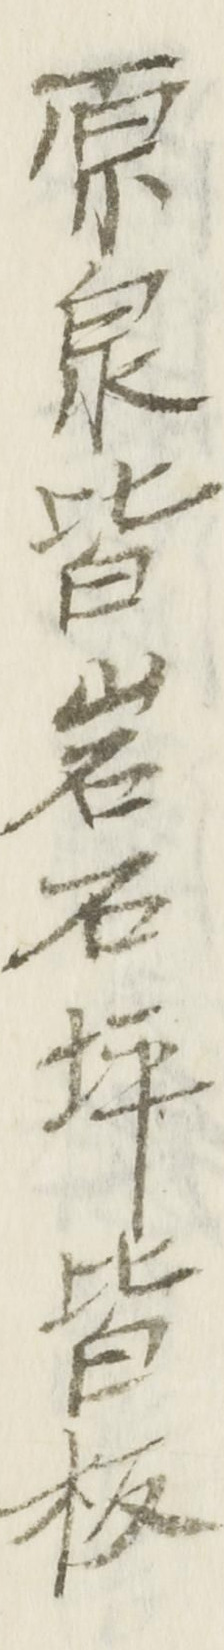原泉皆岩石坪皆板
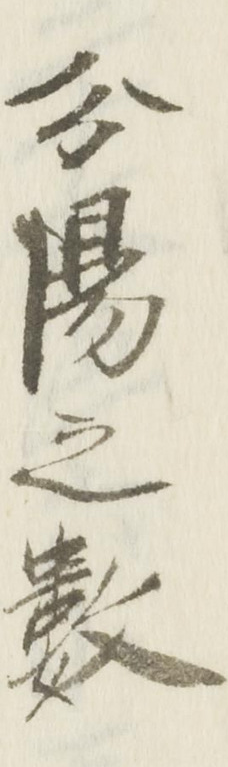分湯之数
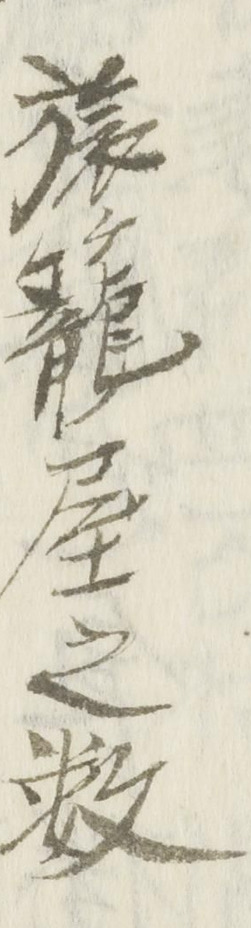旅籠屋之数
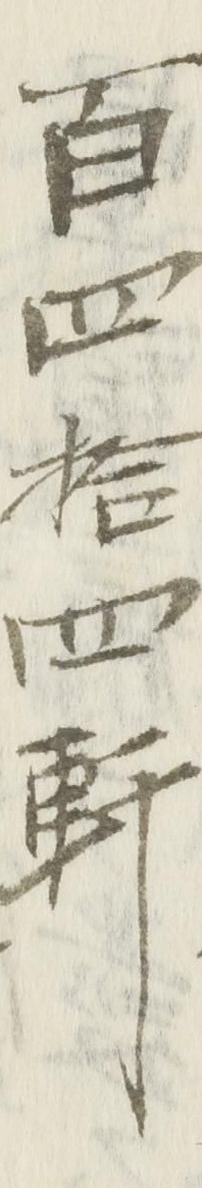百四拾四軒
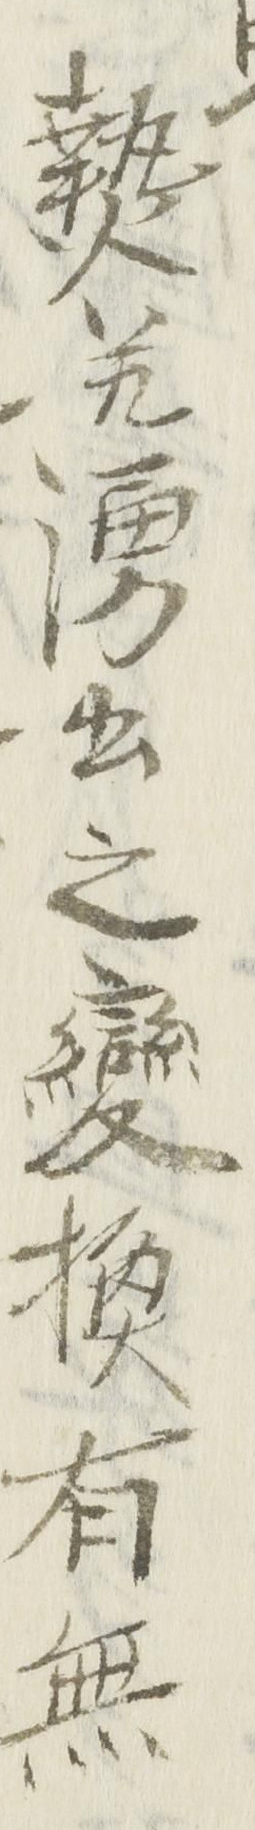熱並湧出之変換有無
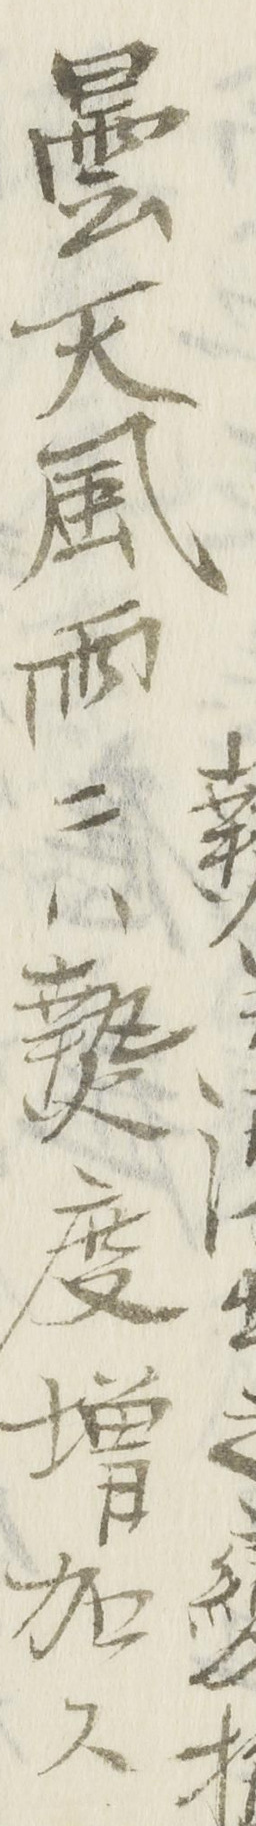曇天風雨ニハ熱度増加ス
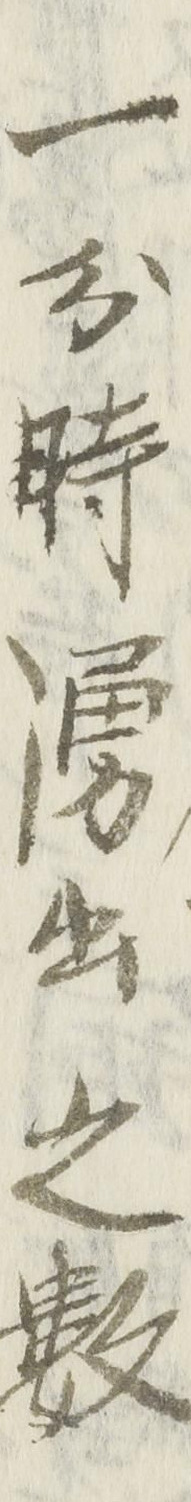一分時湧出之数
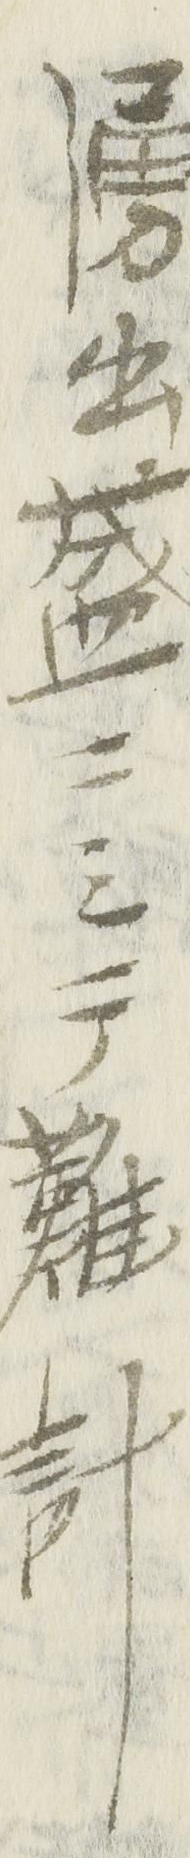湧出盛ニシテ難計
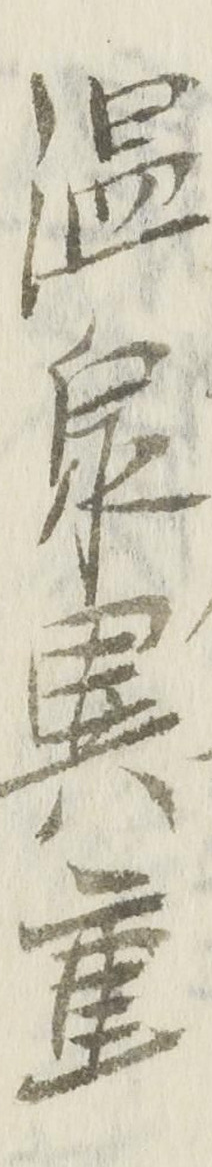温泉異重
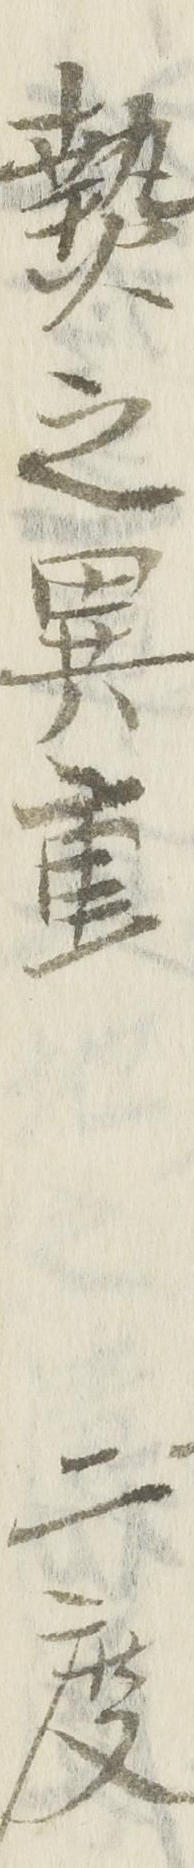熱之異重二度

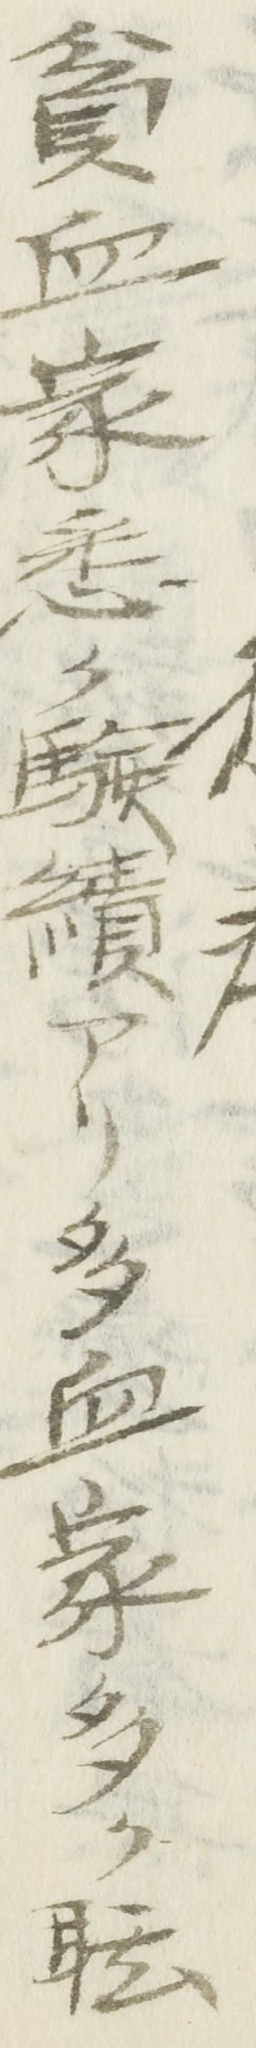貧血家悉ク験績アリ多血家多ク眩
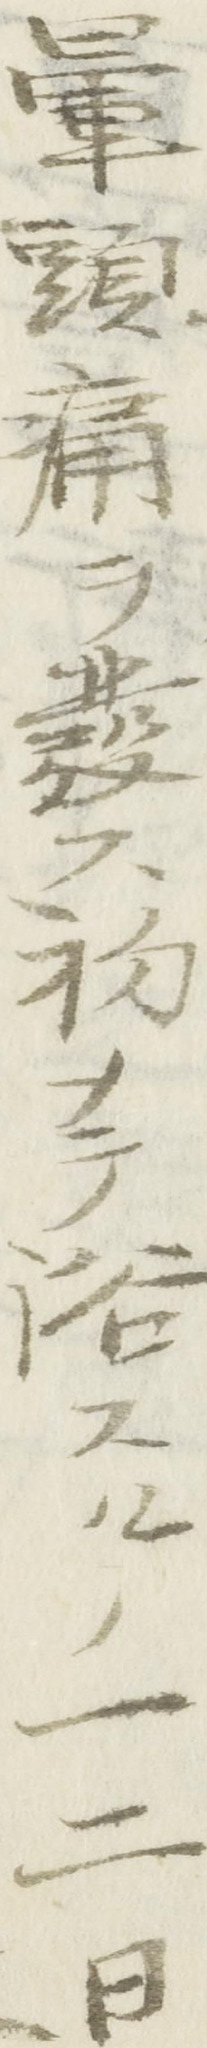暈頭痛ヲ発ス初メテ浴スルノ一二日
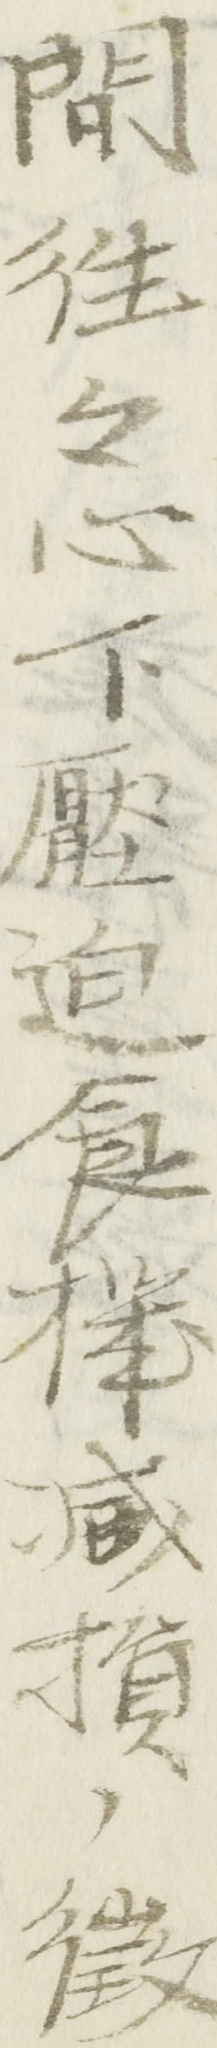間往々心下圧迫食機減損ノ徴
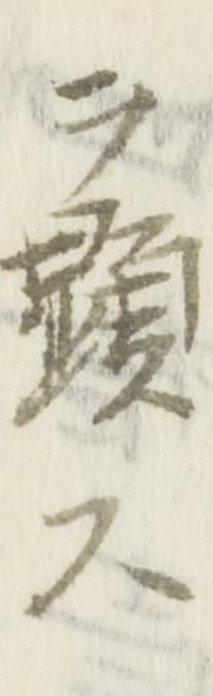ヲ顕ス
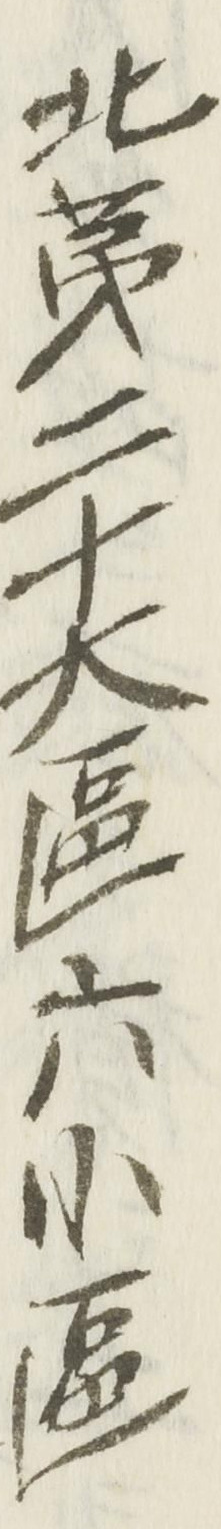北第二十大区六小区
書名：温冷泉試験表
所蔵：東京大学地震研究所図書室 Earthquake Research Institute Library, The University of Tokyo, JAPAN
